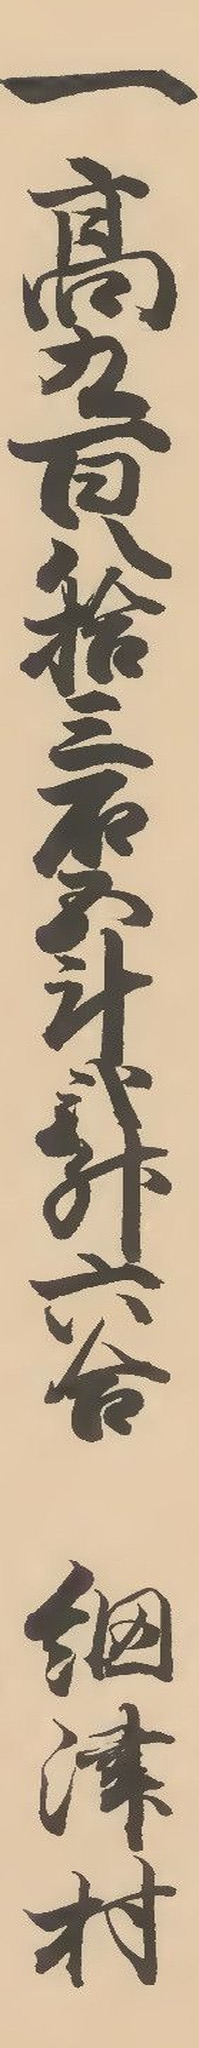一髙九百八拾三石五斗弐升六合津村
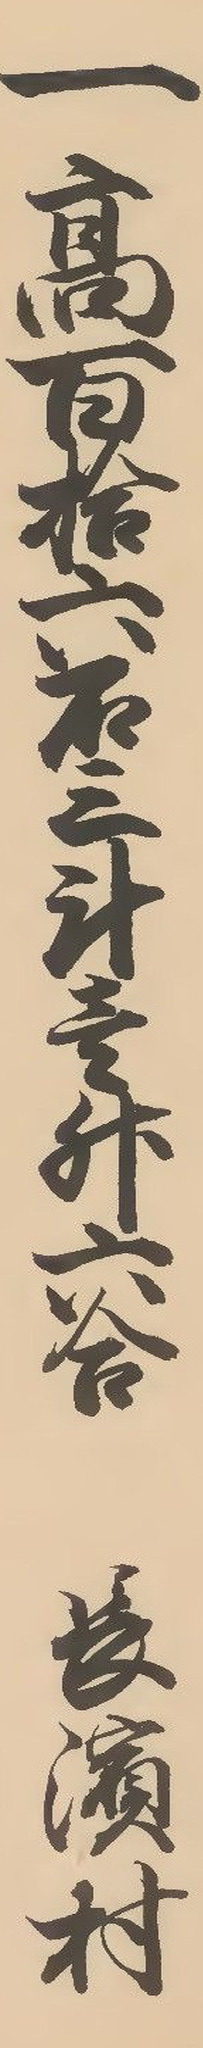一髙百拾六石三斗壱升六合長濱村
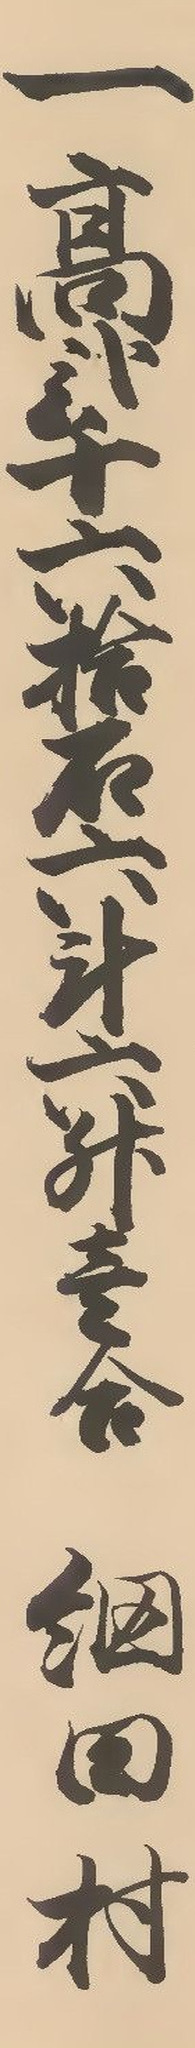一髙弐千六拾石六斗六升壱合田村
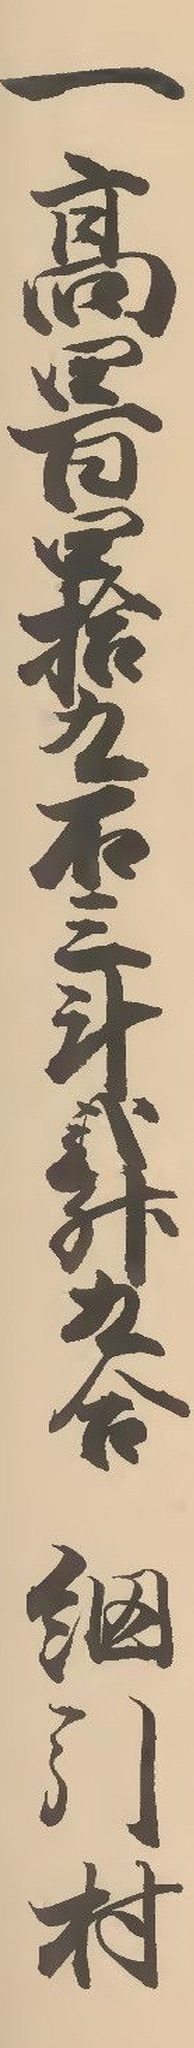一髙四百四拾九石三斗弐升九合引村
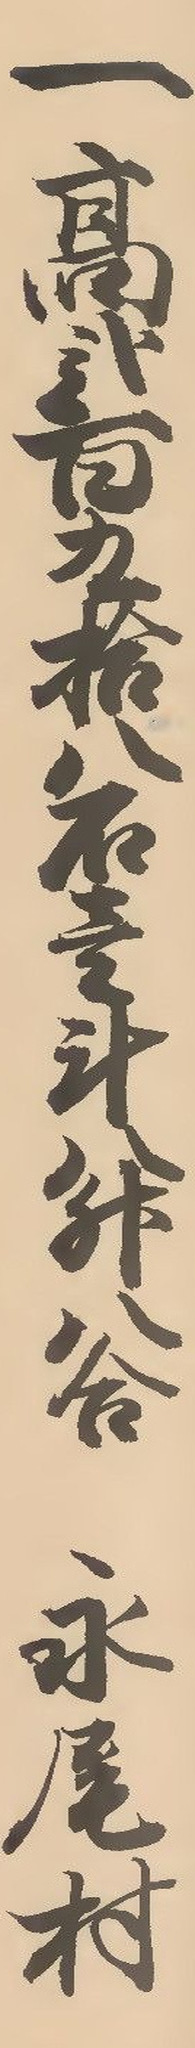一髙弐百九拾八石弐斗八升八合永尾村
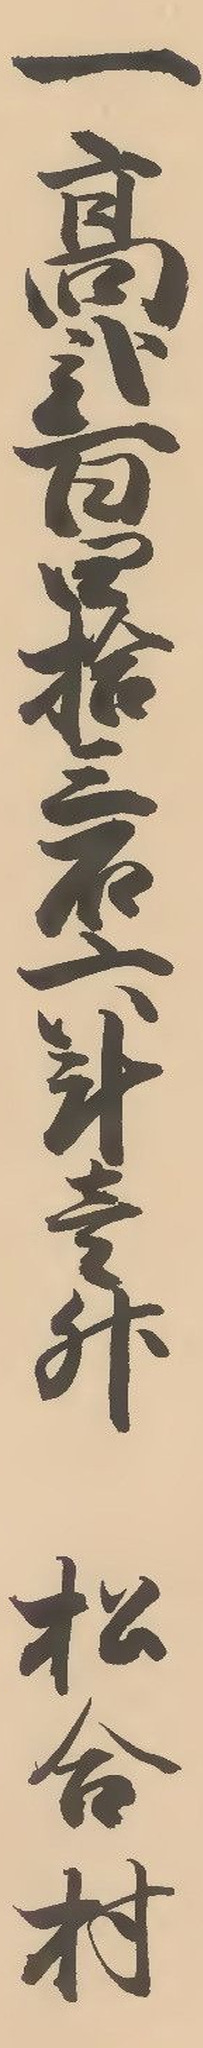一髙弐百四拾三石六斗壱升松合村
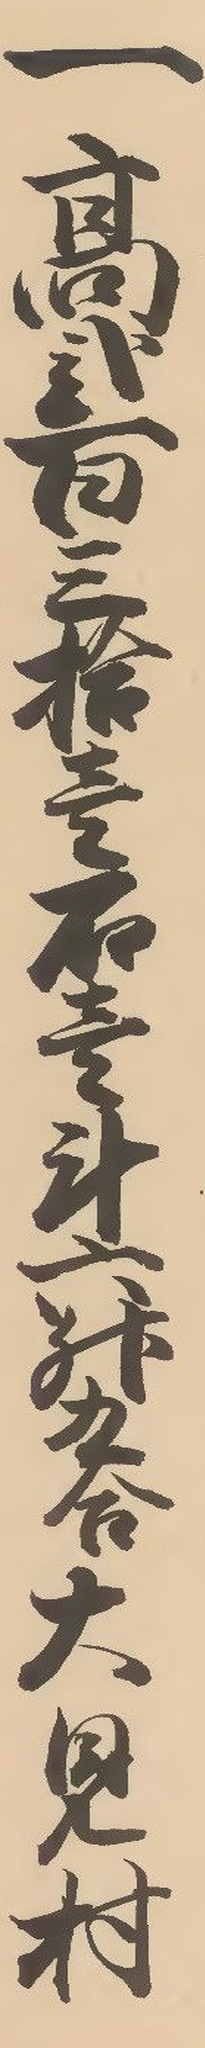一髙弐百三拾壱石壱斗六升九合大見村
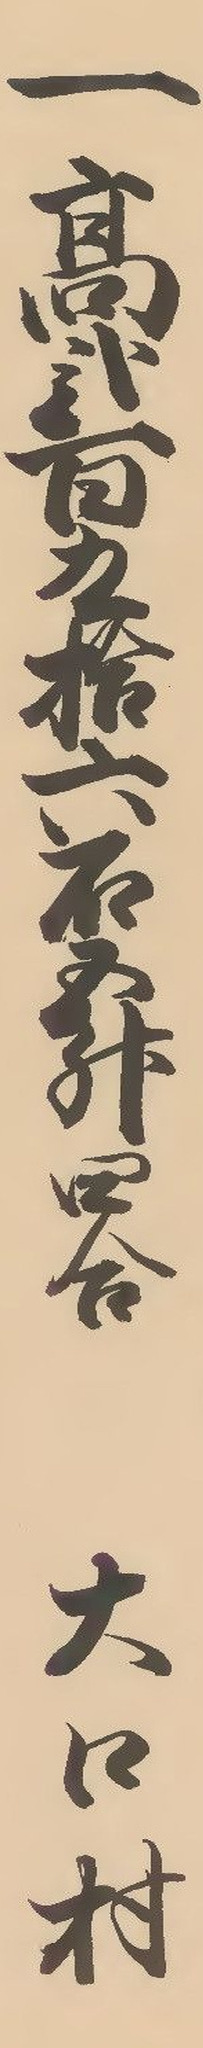一髙弐百九拾六石五升四合大口村

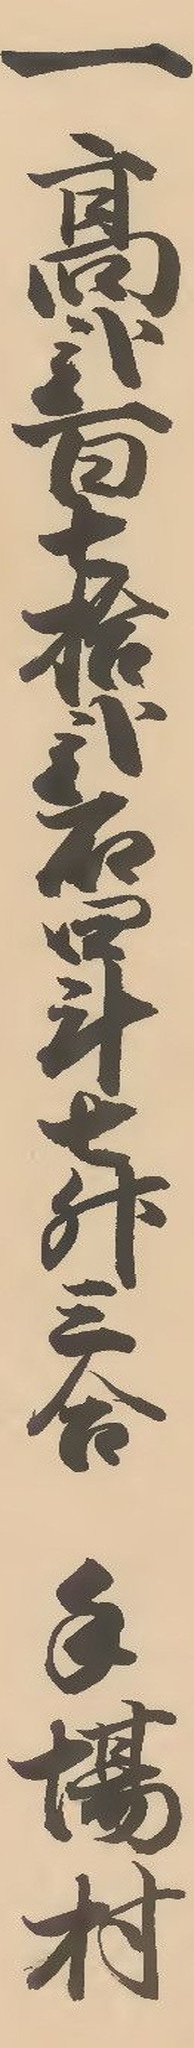一髙弐百七拾弐石四斗七升三合手場村
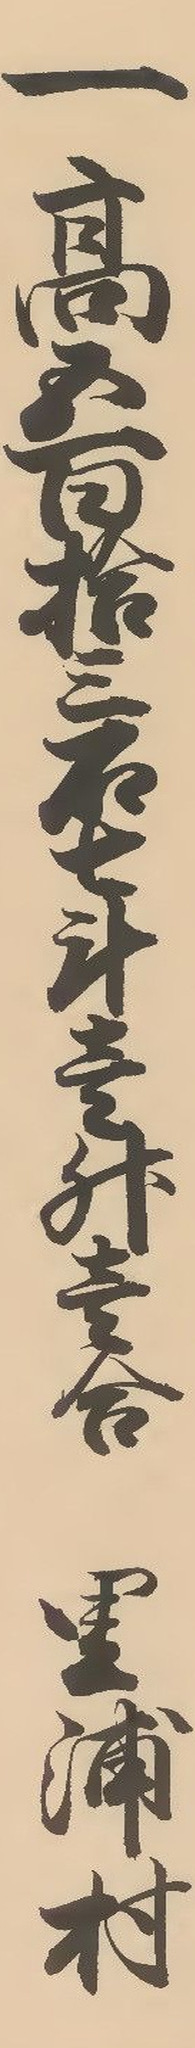一髙五百拾三石七斗壱升壱合里浦村
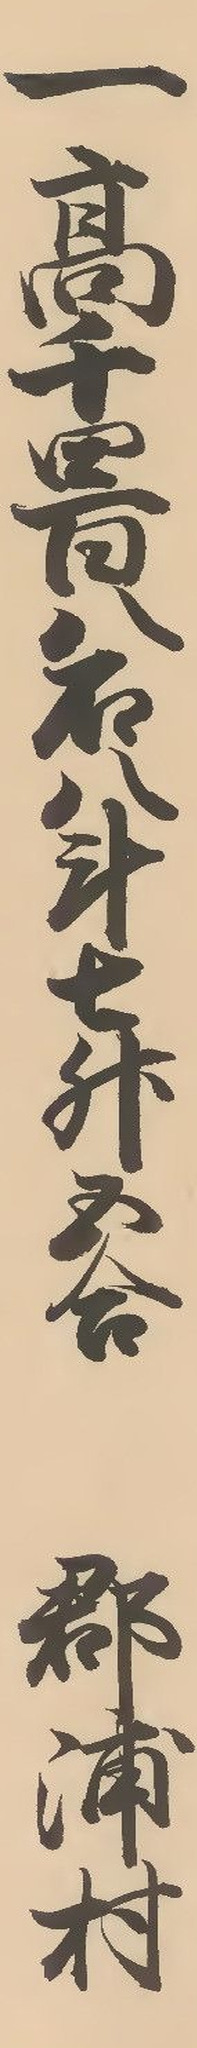一髙千四百八石八斗七升五合郡浦村
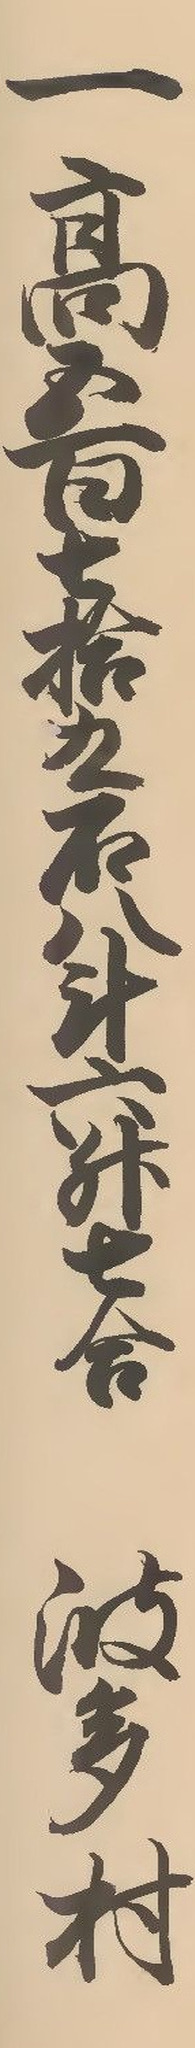一髙五百七拾九石八斗六升七合波多村
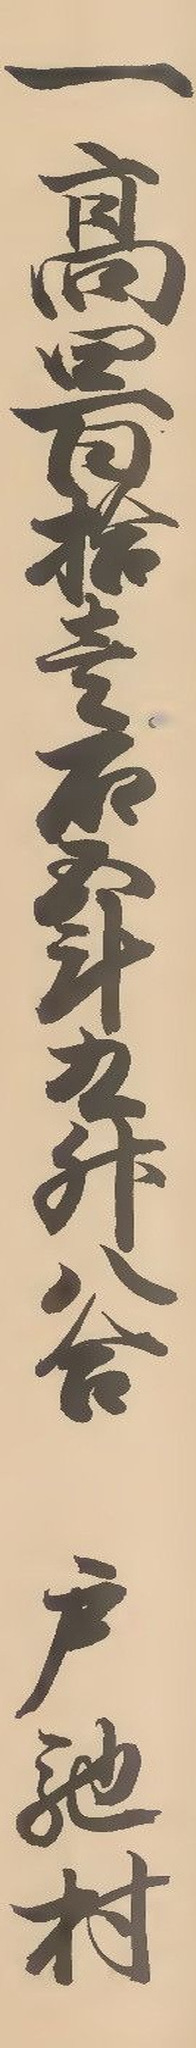一髙四百拾壱石五斗九升八合戸馳村
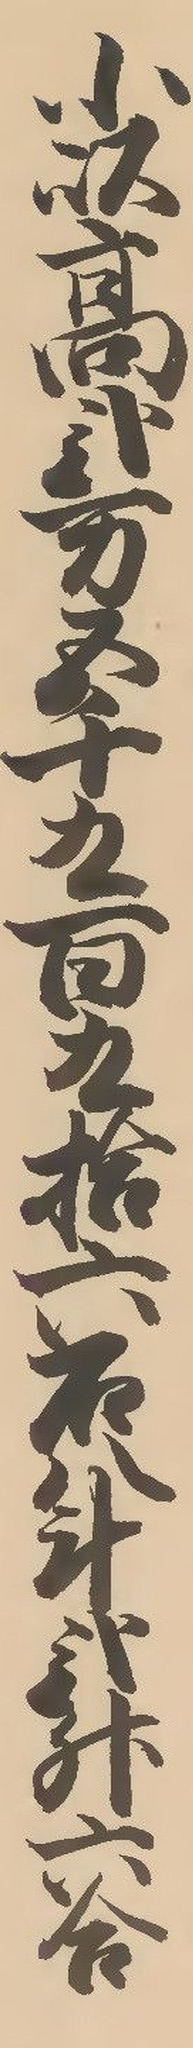小以髙二万五千九百九拾六石八斗弐升六合

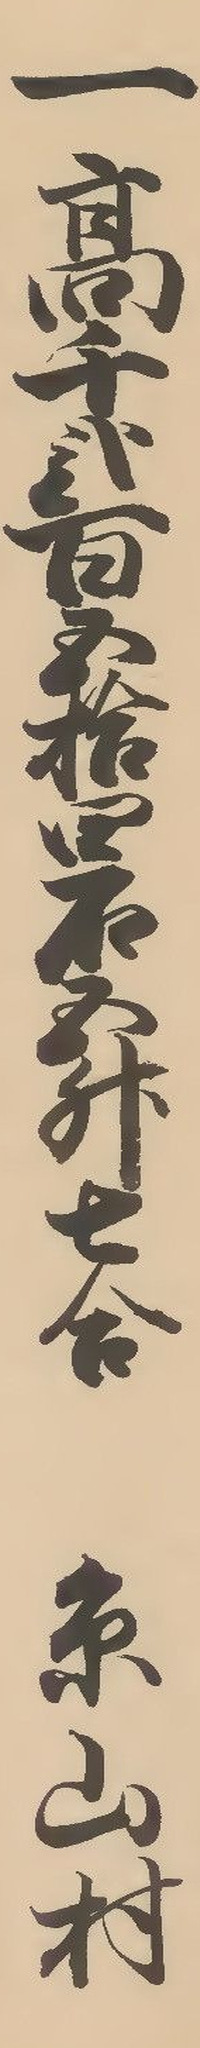一髙千弐百五拾四石五升七合糸山村
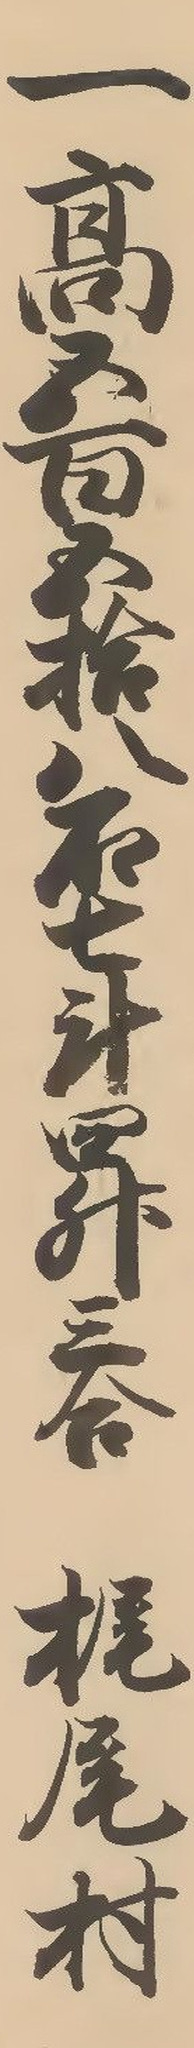一髙五百五拾八石七斗四升三合梶尾村
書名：肥後国郷帳
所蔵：国立公文書館 National Archives of Japan
